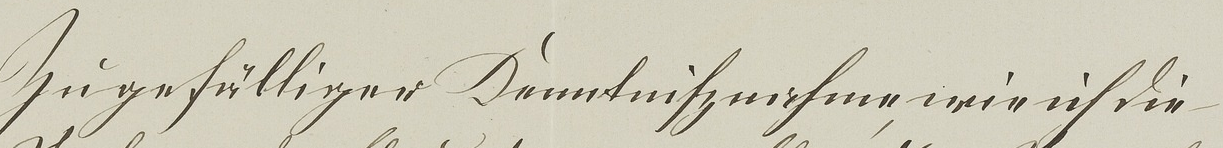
Zu gefälliger Kenntnisznahme, wie ich die
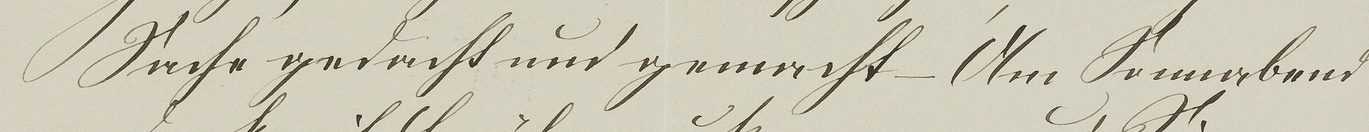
Sache gedacht und gemacht – Am Sonnabend
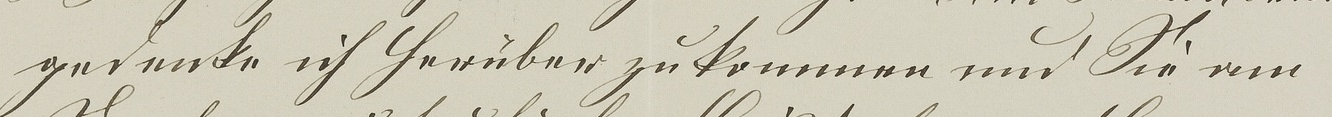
gedenke ich herüber zu kommen und Sie am
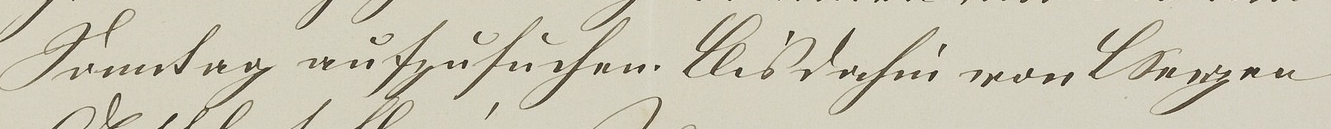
Sonntag aufzusuchen. Bis dahin von Herzen
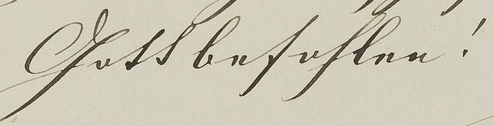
Gott befohlen!
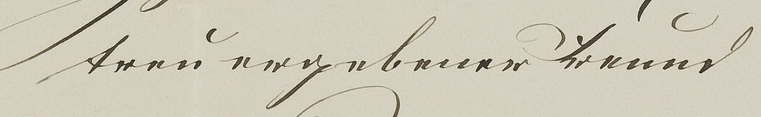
treu ergebener Freund
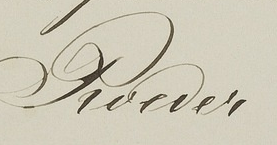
Roeder
